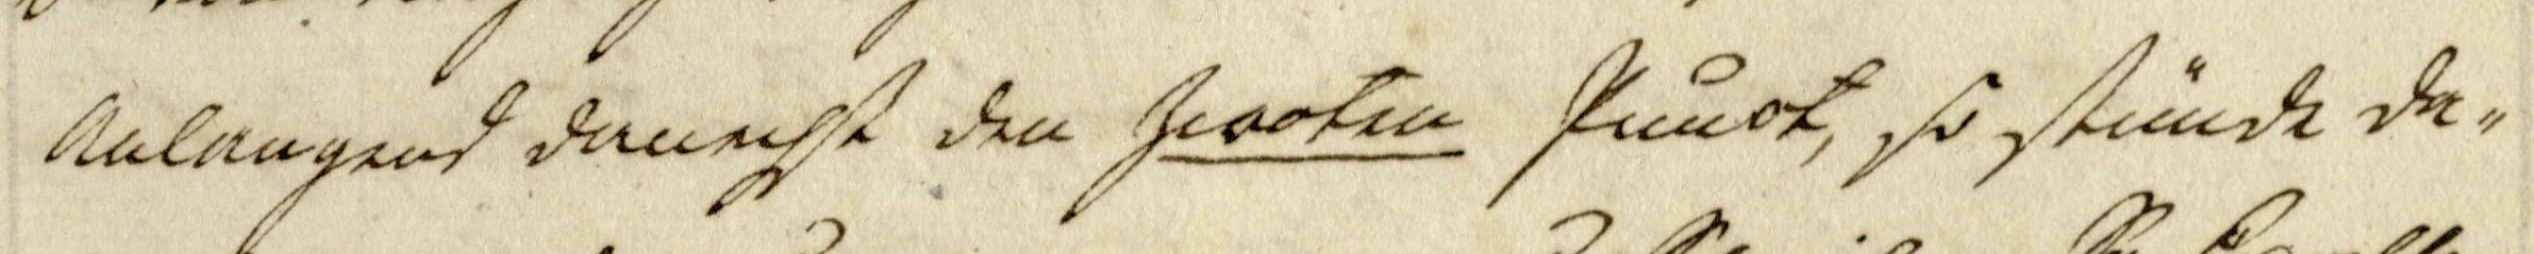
Anlangend danechst den zwoten Punct, so stünde da¬
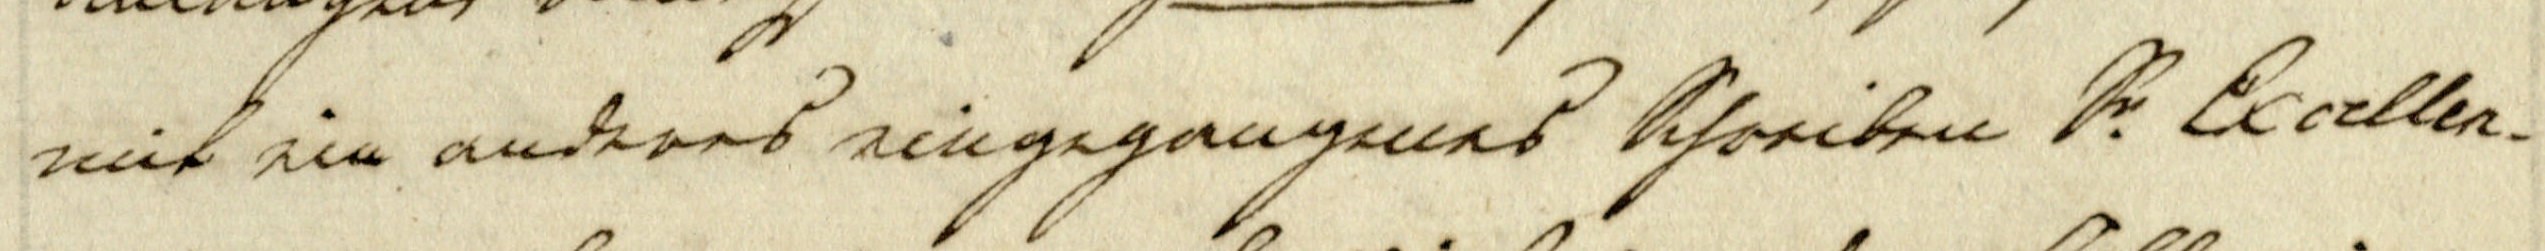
mit ein anderes eingegangenes Schreiben Sr. Excellen¬
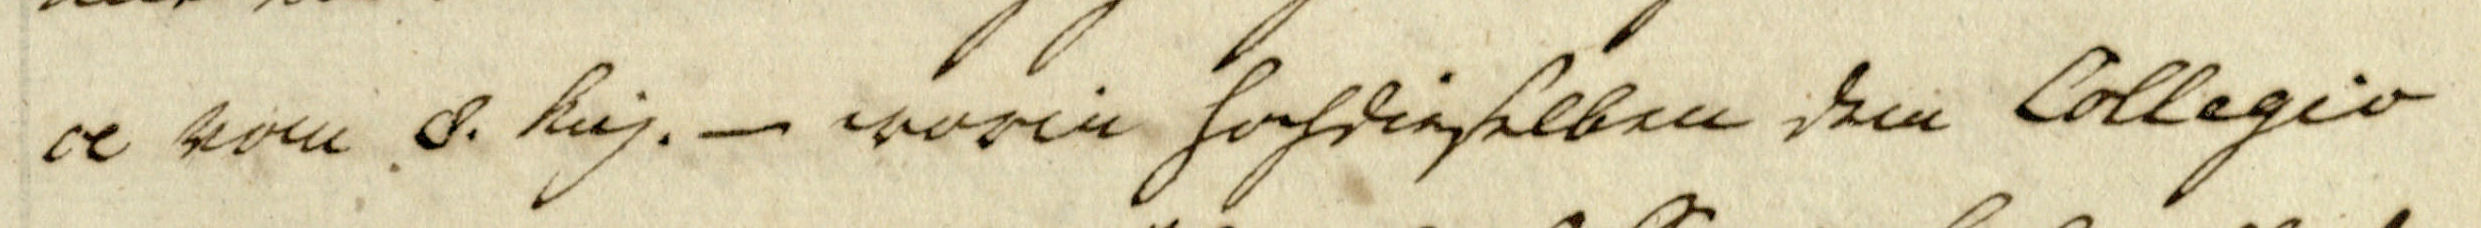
ce vom 8. huj. worin hochdieselben dem Collegio
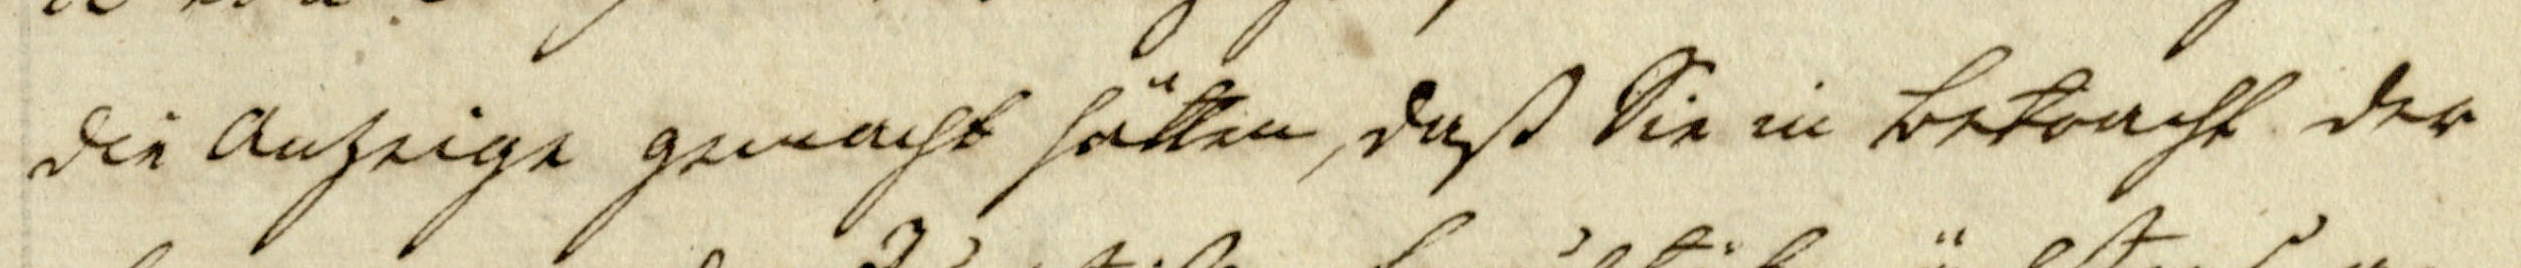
die Anzeige gemacht hätten, daß Sie in Betracht der
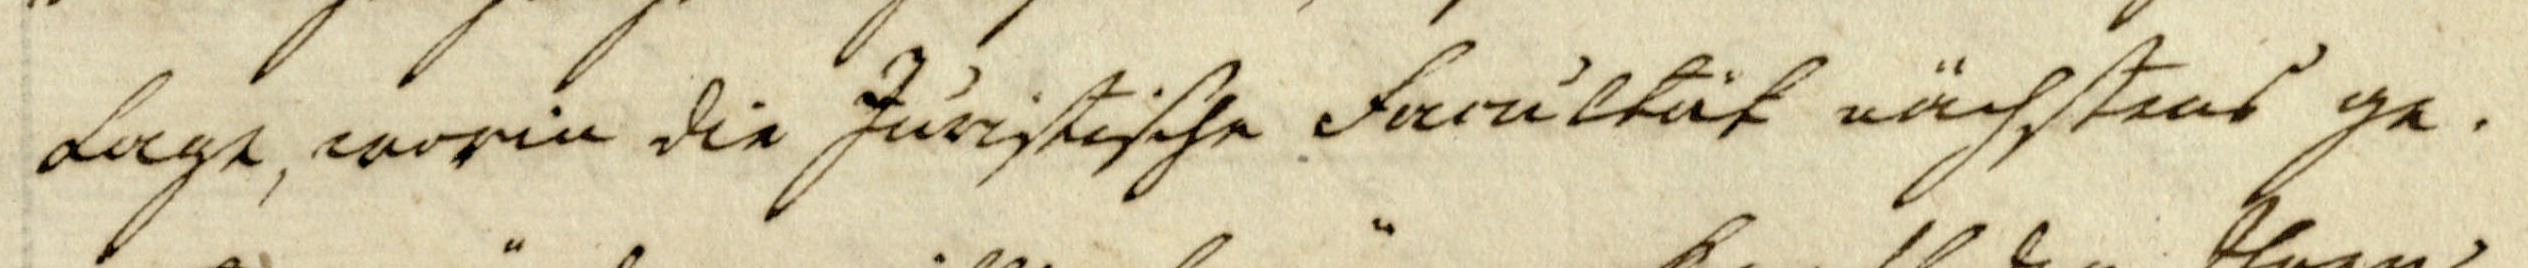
Lage, worin die Juristische Facultät nächstens ge¬
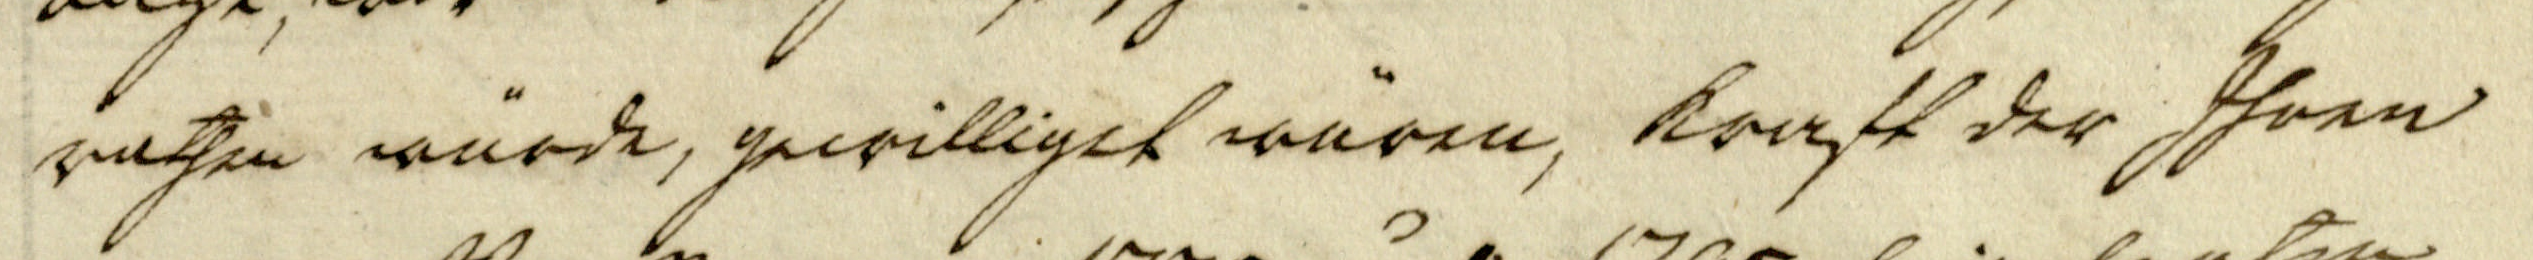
rathen würde, gewilliget wären, Kraft der Ihren
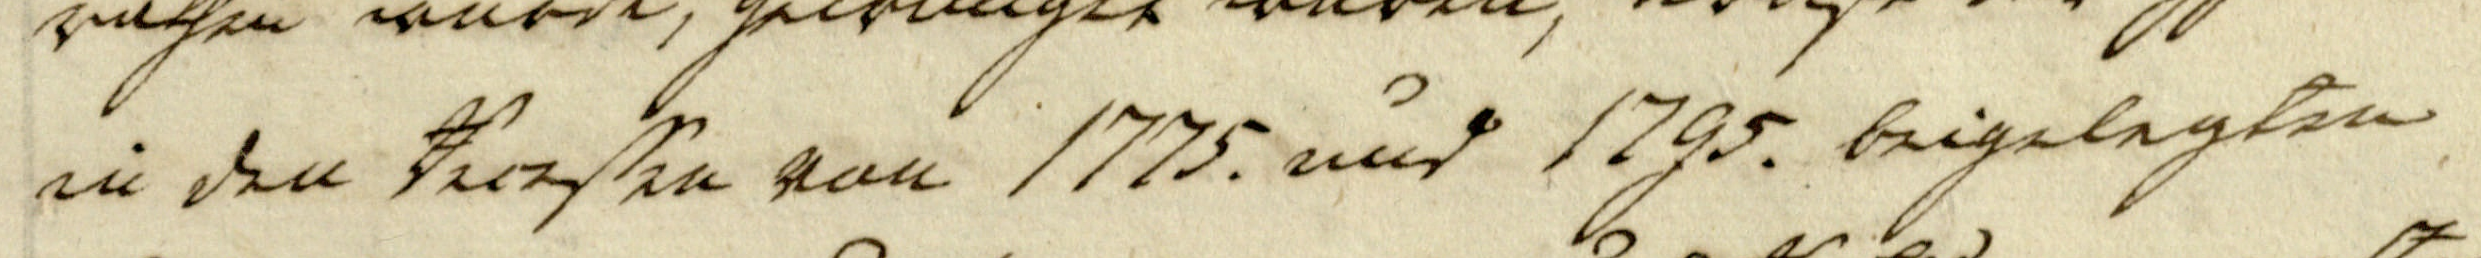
in den Recessen von 1775. und 1795. beigelegten
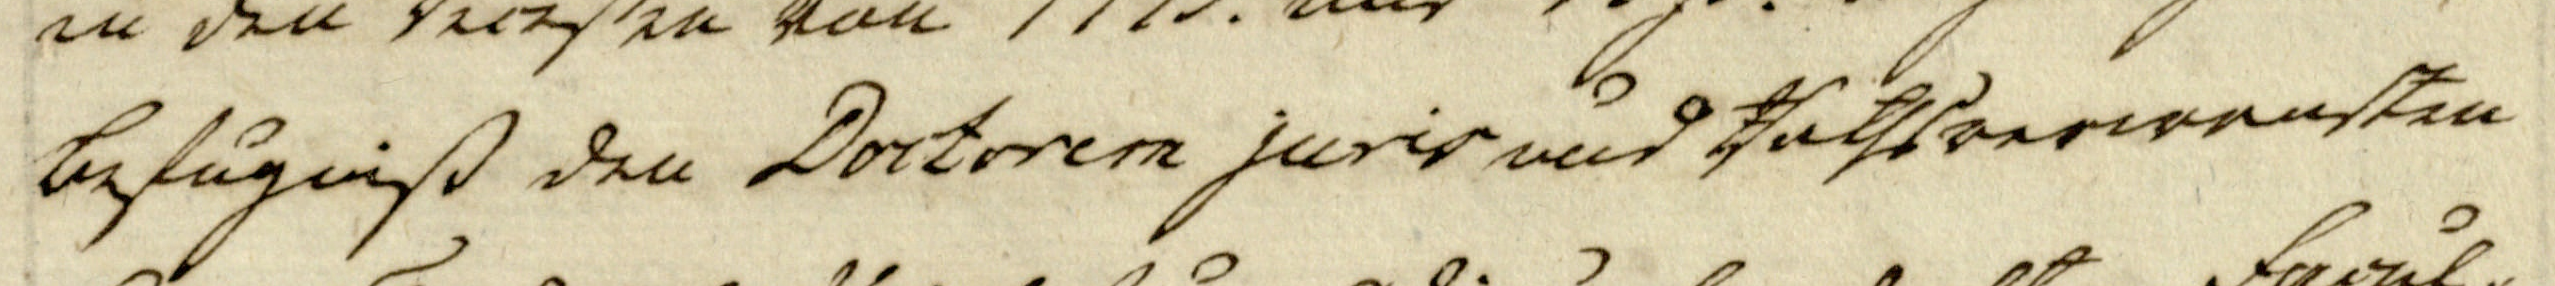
Befugniß den Doctorem juris und Rechtsverwandten
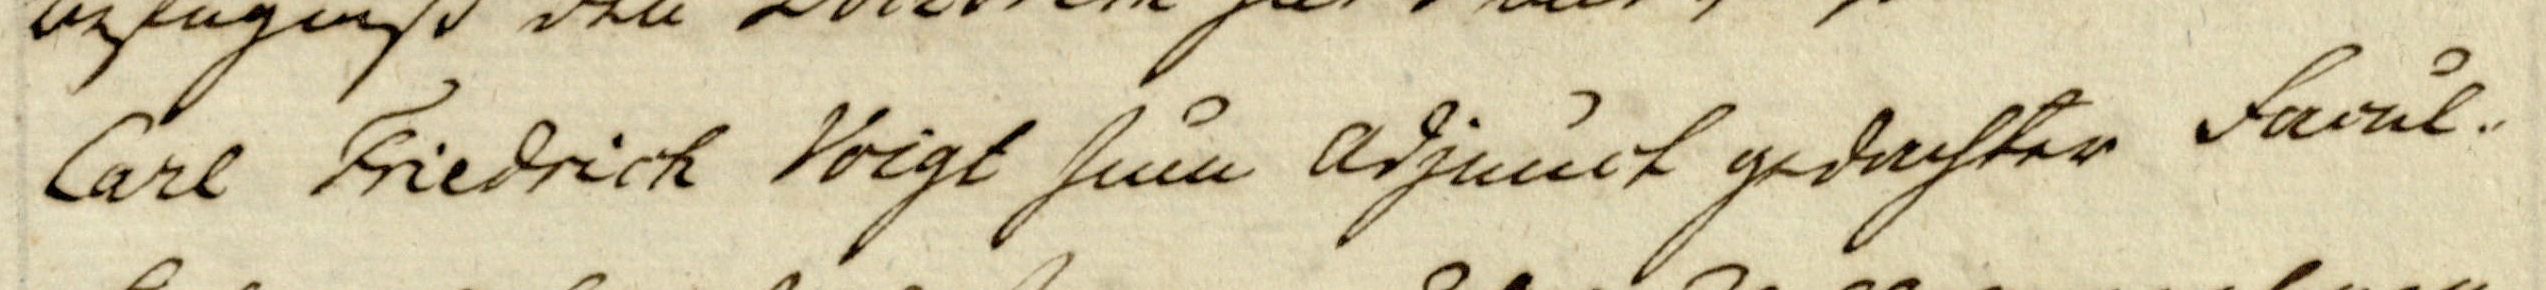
Carl Friedrich Voigt zum Adjunct gedachter Facul¬
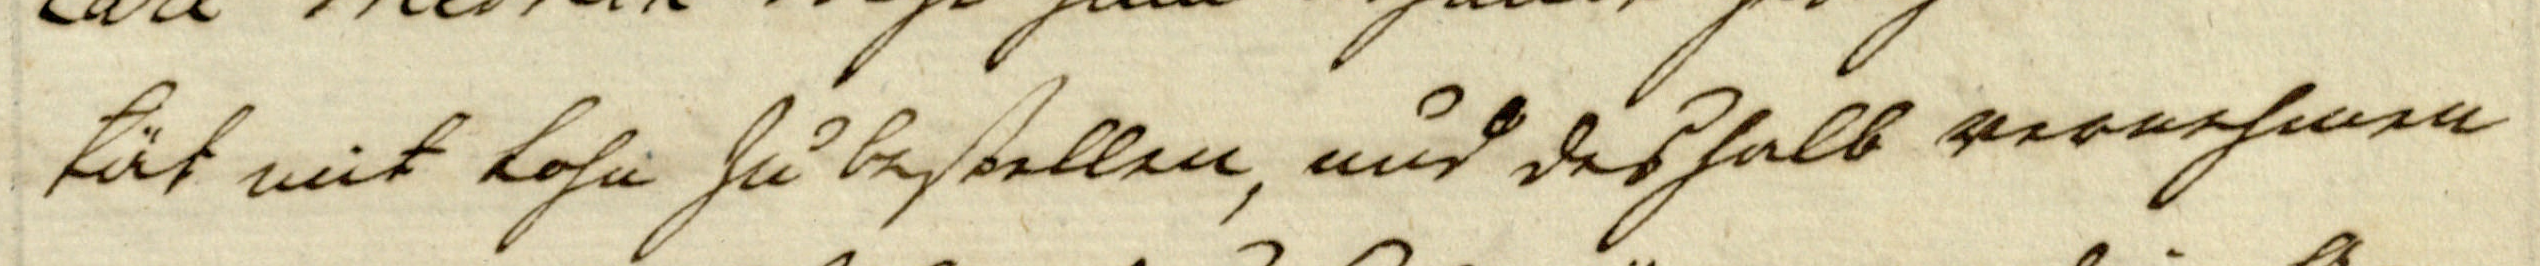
tät mit Lohn zu bestellen, und deshalb vernehmen
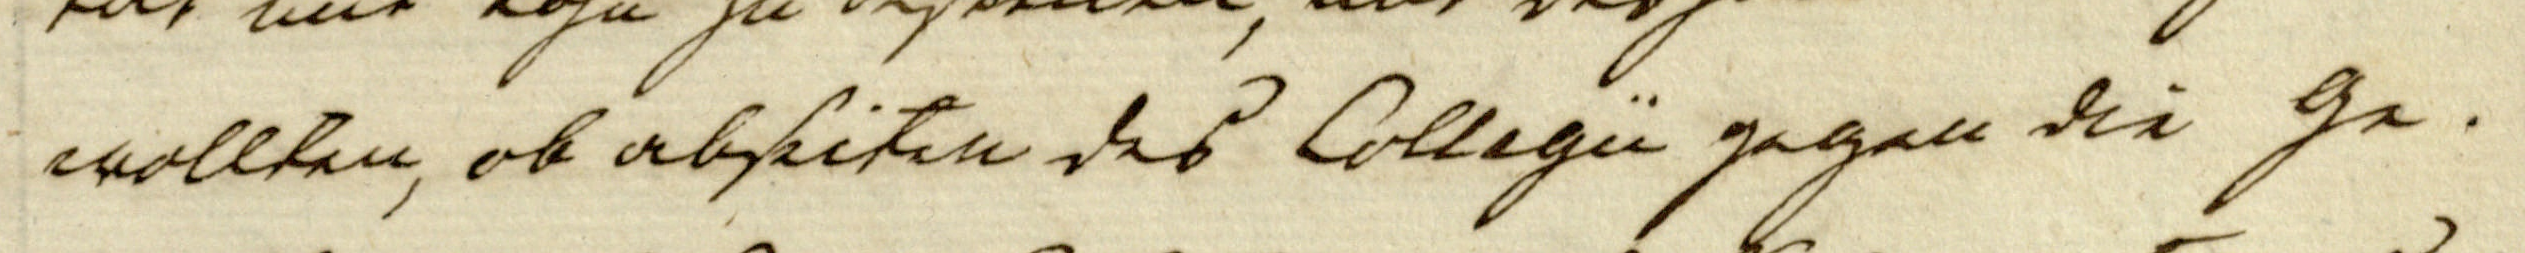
wollten, ob abseiten des Collegii gegen die Ge¬
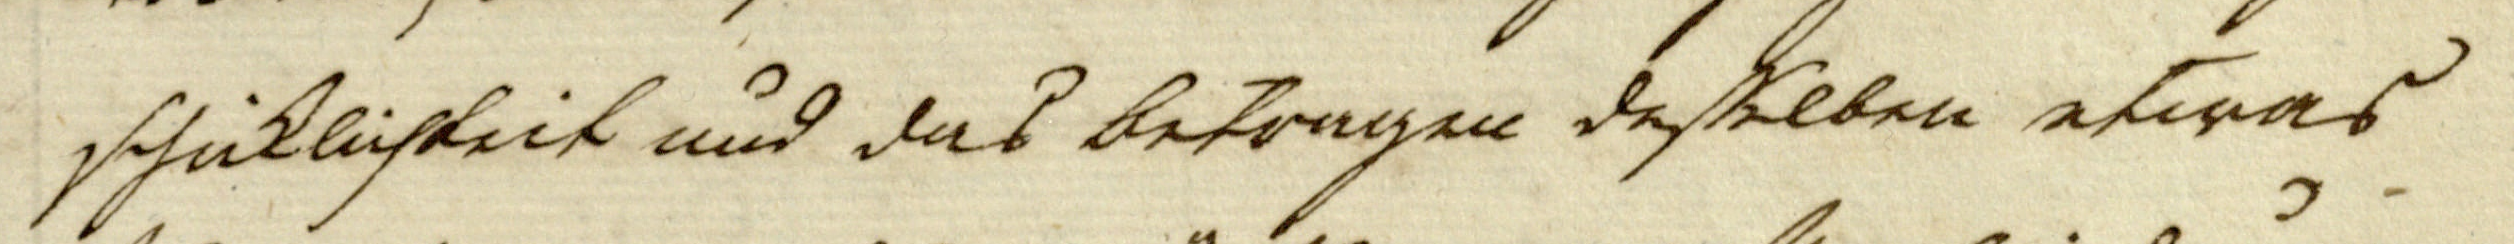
schicklichkeit und das Betragen desselben etwas
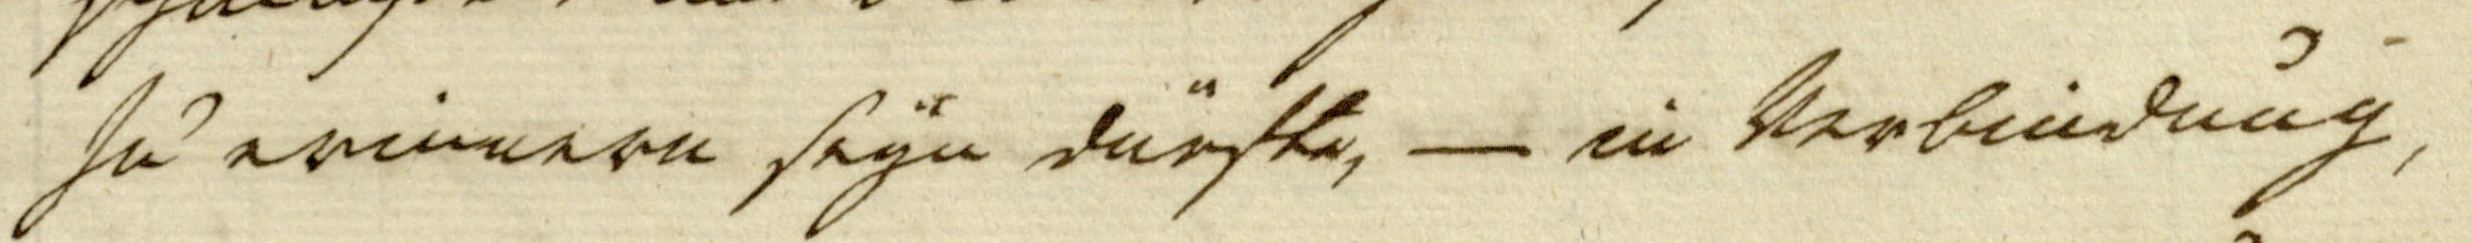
zu erinnern seÿn dürfte, in Verbindung,
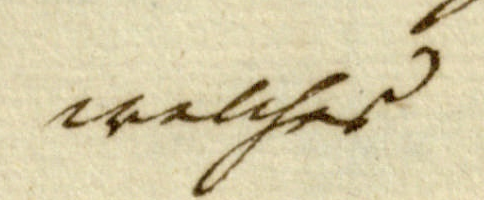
welches
